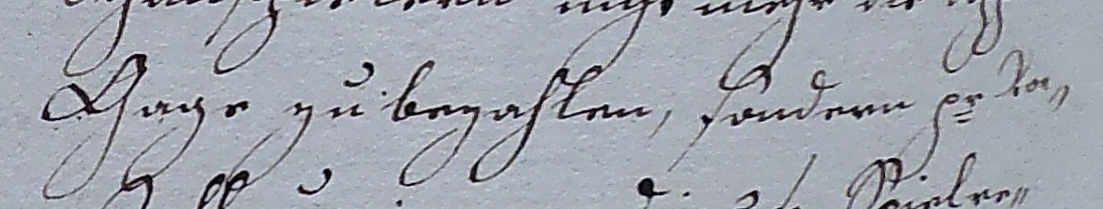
Gage zu bezahlen, sondern pr͇ Vor¬
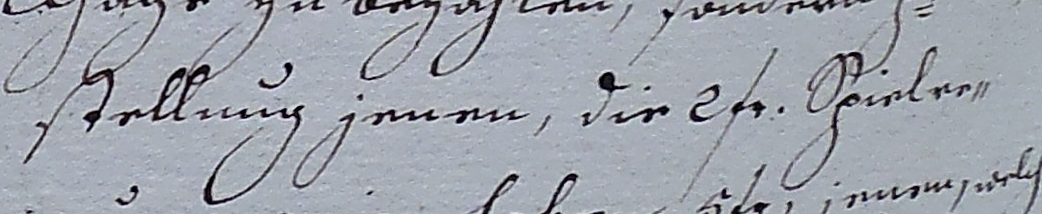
stellung jenen, die 2fr. Spielre¬
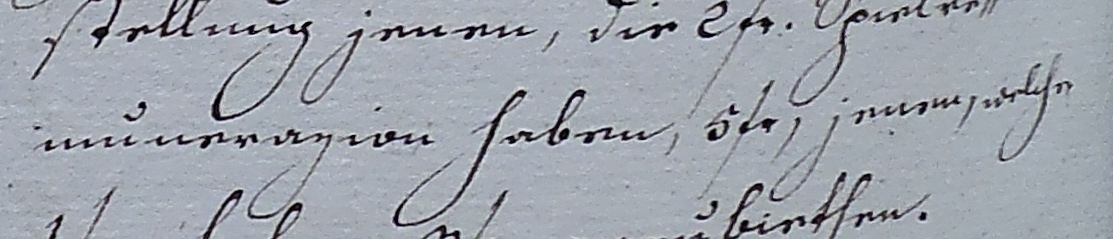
munerazion haben, 5fr, jenen, welche
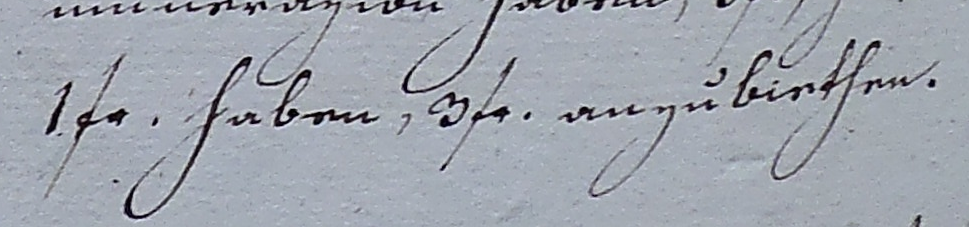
1fr. haben, 3fr. anzubiethen.
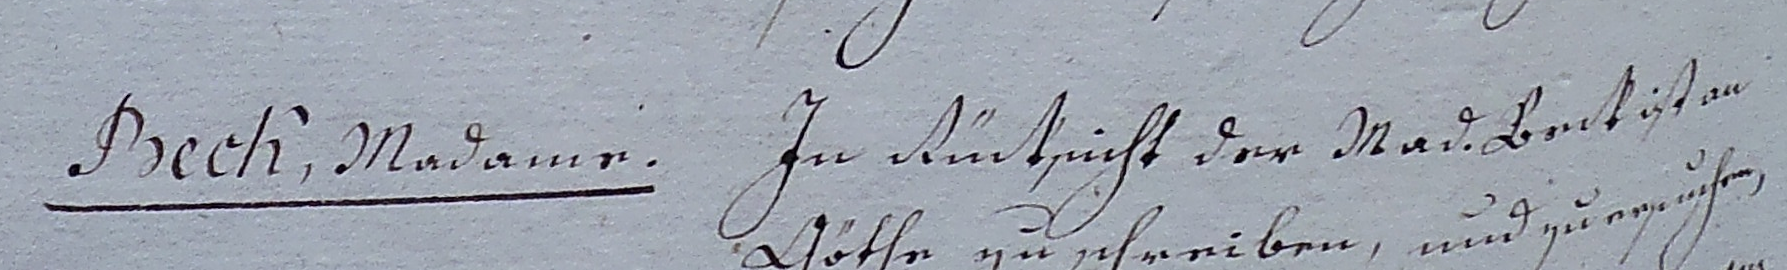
Beck, Madame. In Rücksicht der Mad. Beck ist an
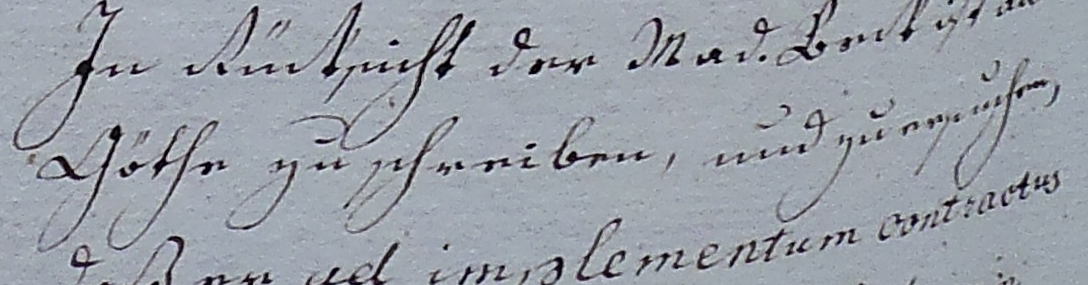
Göthe zu schreiben, und zu ersuchen,
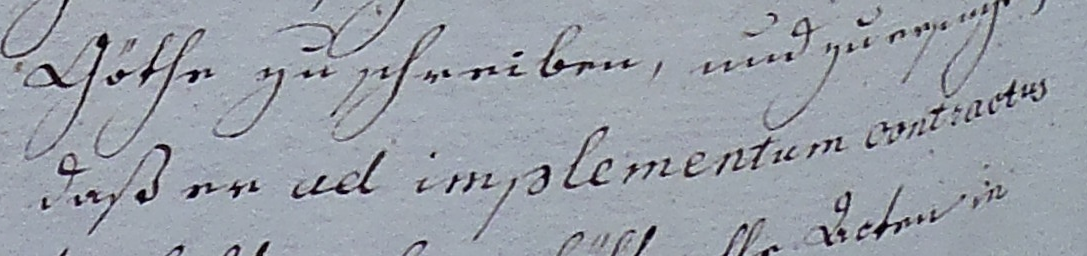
daß er ad implementum contractus
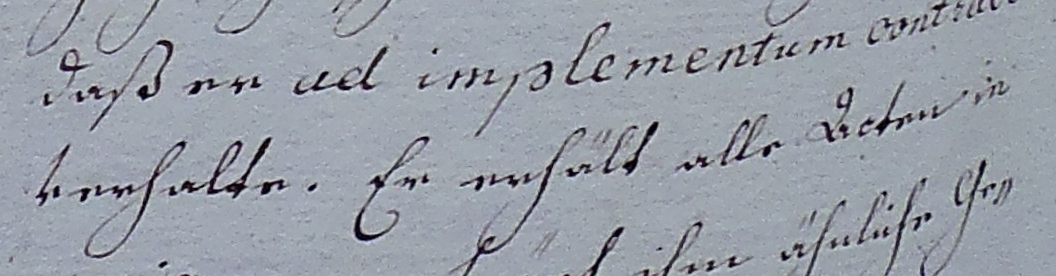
verhalte. Er erhält alle Acten in
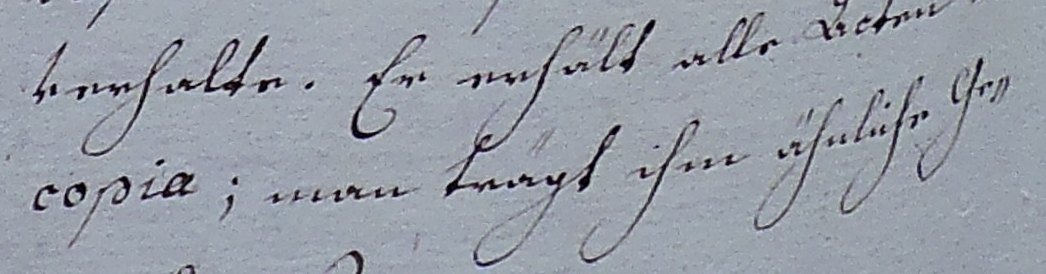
copia; man trägt ihm ähnliche Ge¬
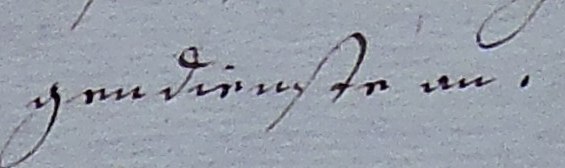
gendienste an.
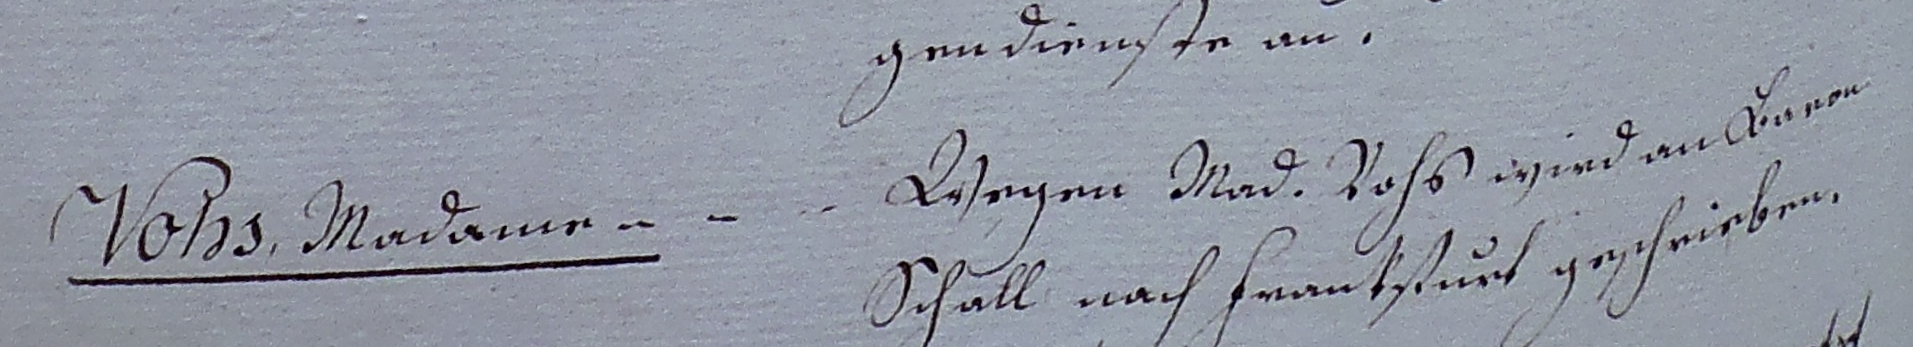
Vohs, Madame .. .. .. Wegen Mad. Vohs wird an Baron
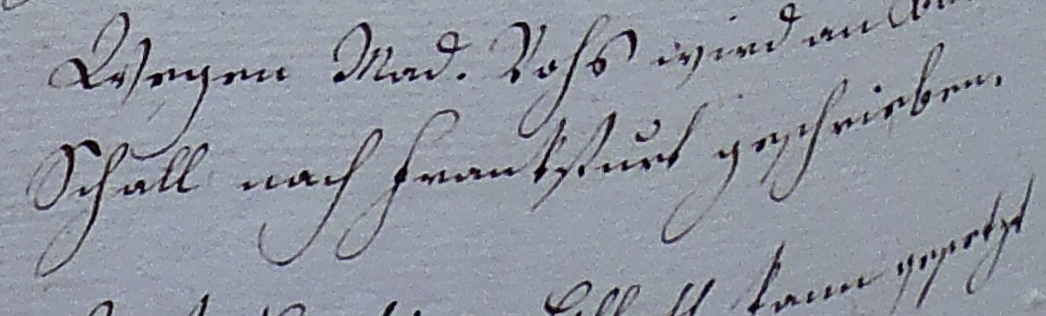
Schall nach Frankfurt geschrieben.
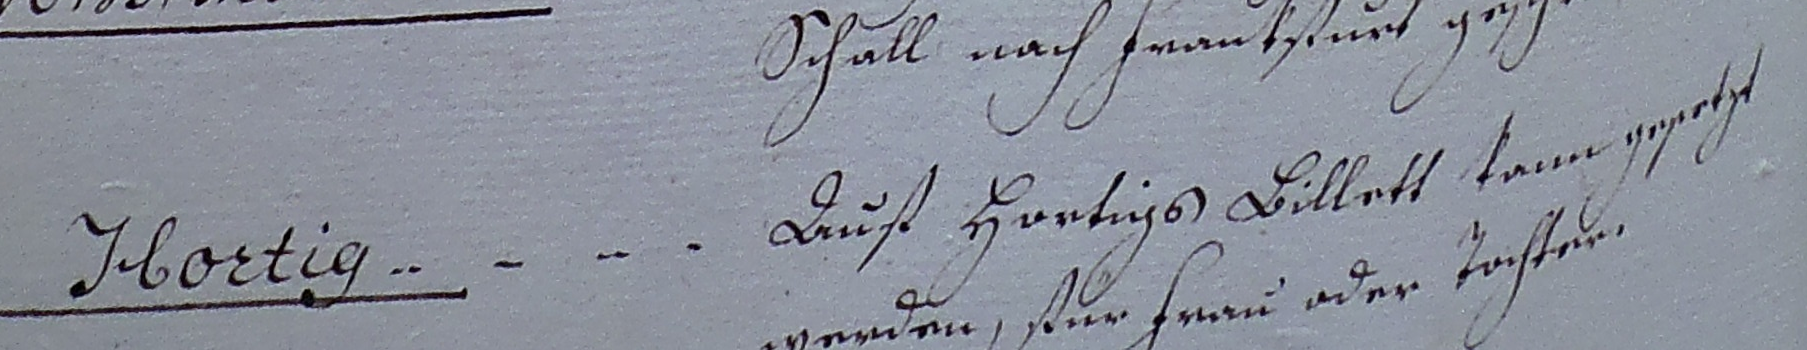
Hortig .. .. .. . Auf Hortigs Billet kann gesetzt
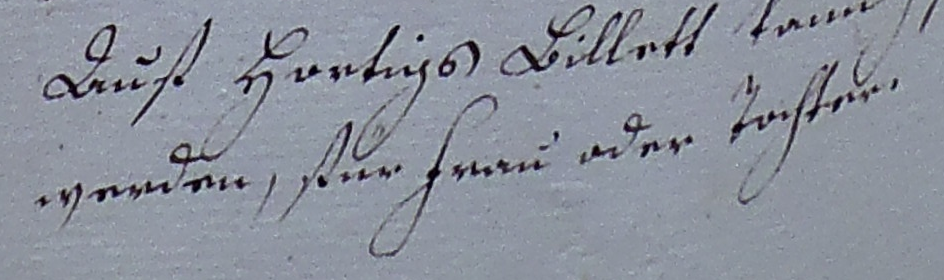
werden, für Frau oder Tochter.
